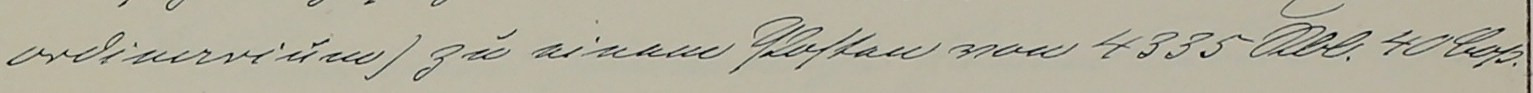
ordinarium) zu einem Posten von 4335 Rbl. 40 Cop.
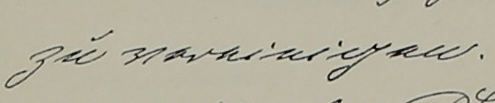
zu vereinigen.
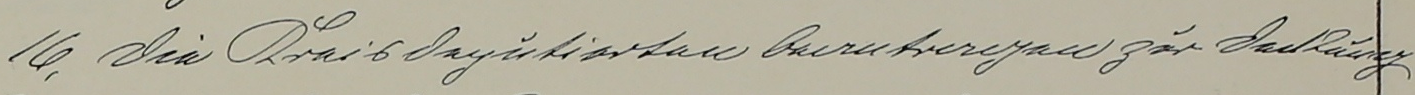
16. Die Kreisdeputierten beantragen zur Deckung
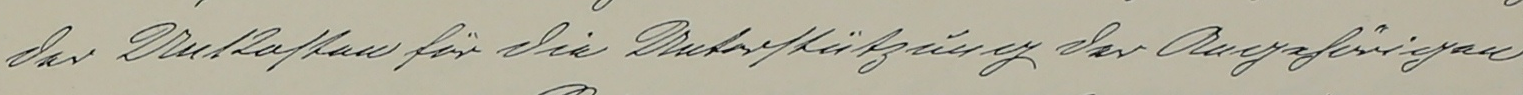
der Unkosten für die Unterstützung der Angehörigen
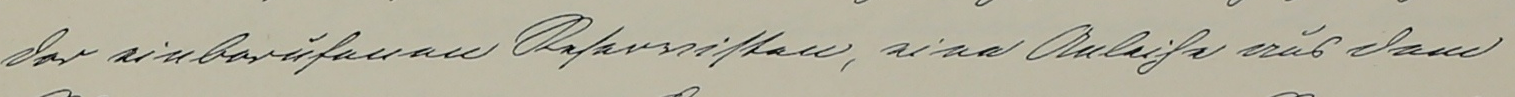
der einberufenen Reservisten, eine Anleihe aus dem
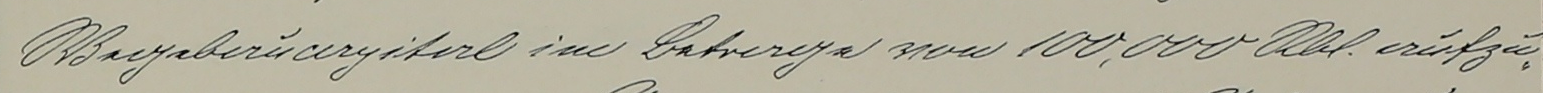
Wegebaucapital im Betrage von 100.000 Rbl. aufzu-
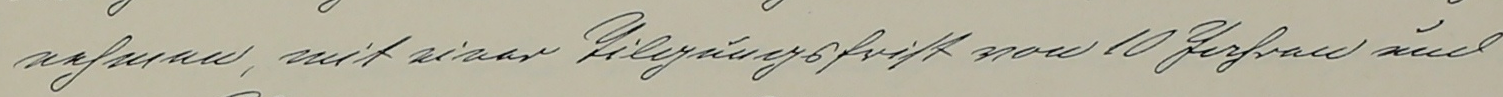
nehmen, mit einer Tilgungsfrist von 10 Jahren und
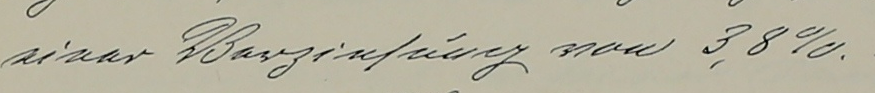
einer Verzinsung von 3,8 %.
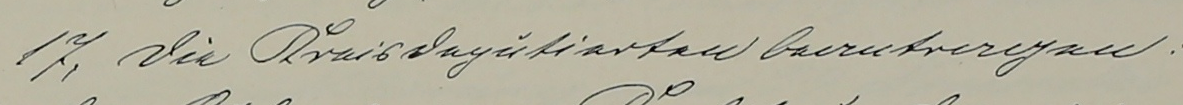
17. Die Kreisdeputierten beantragen:
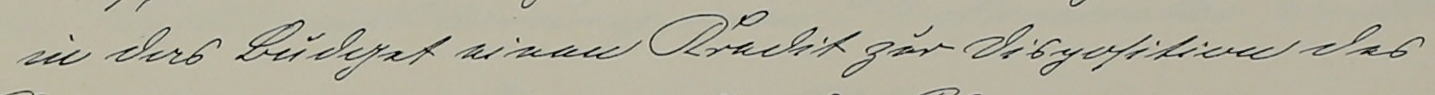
in das Budget einen Kredit zur Disposition des
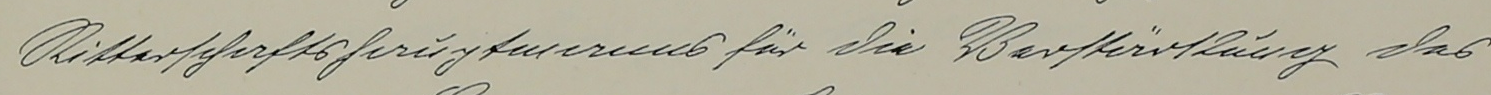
Ritterschaftshauptmanns für die Verstärkung des
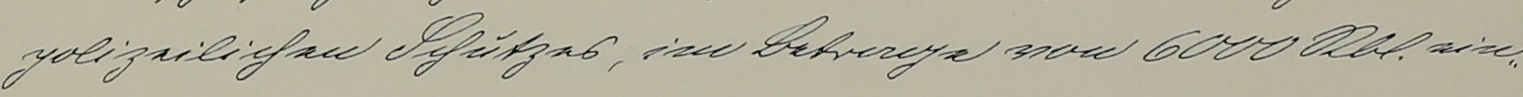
polizeilichen Schutzes, im Betrage von 6000 Rbl. ein-
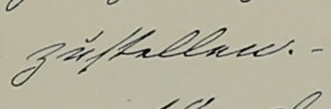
zustellen.
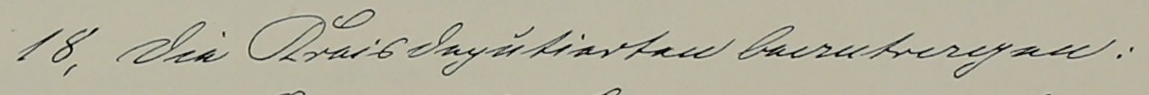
18. Die Kreisdeputierten beantragen:
